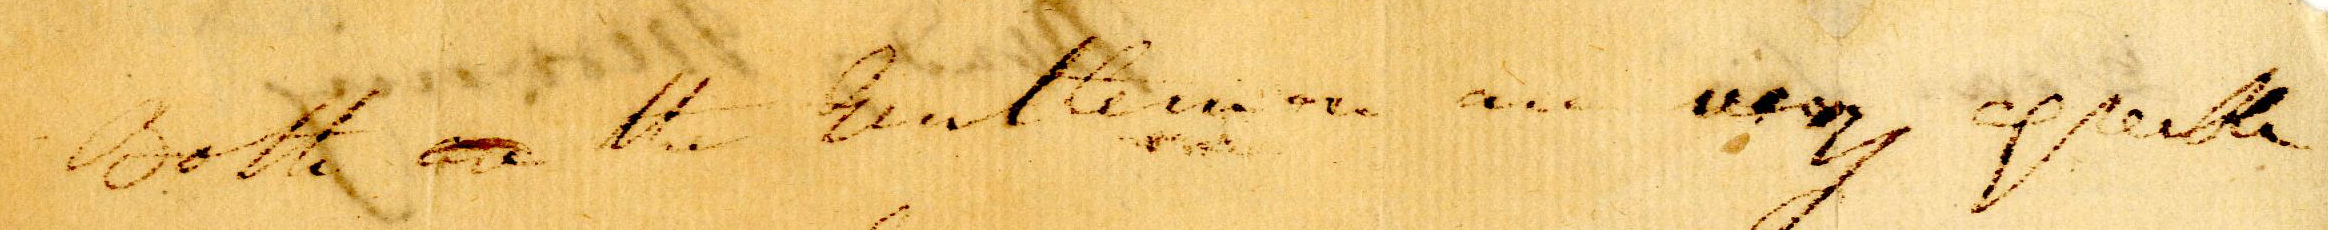Both are the Gentleman are very agreeable
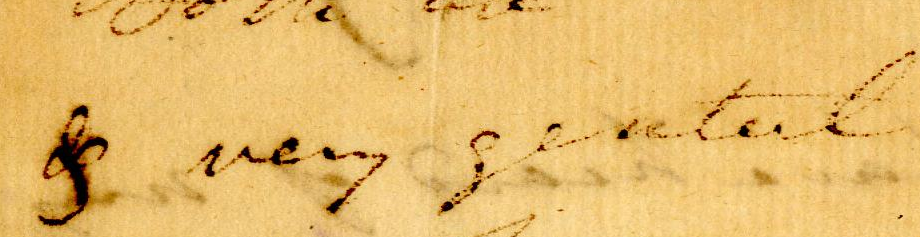& very genteel
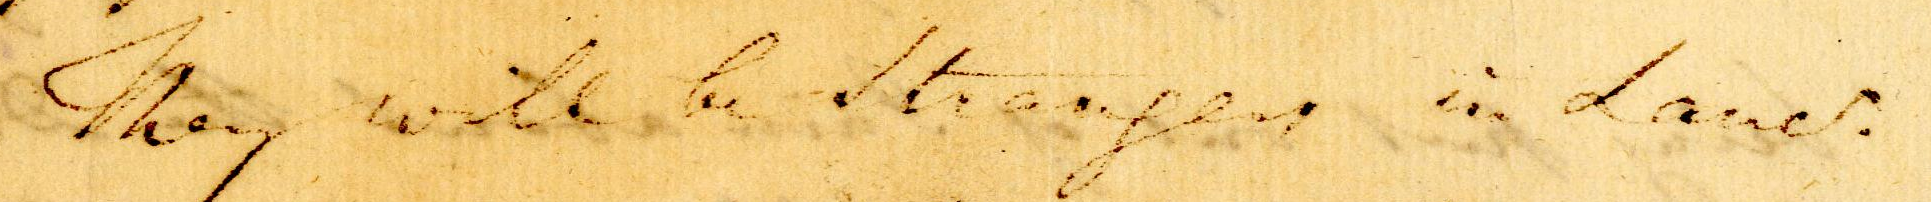They will be Strangers in Land
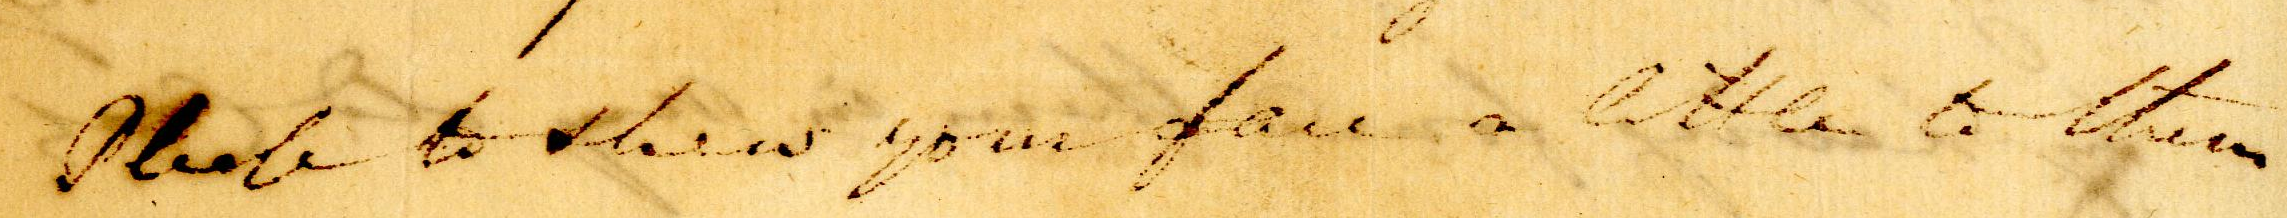Please to shew your face a little to them
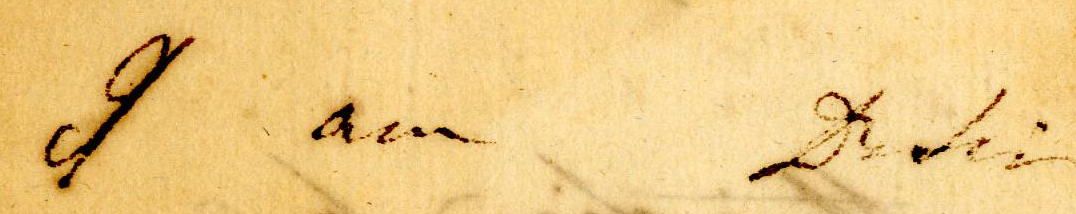I am D^r Sir
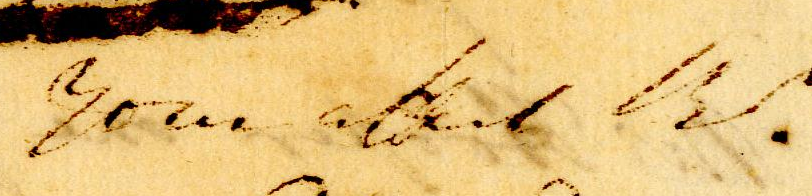Your affect^te
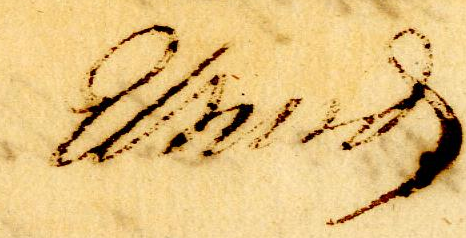Edward
